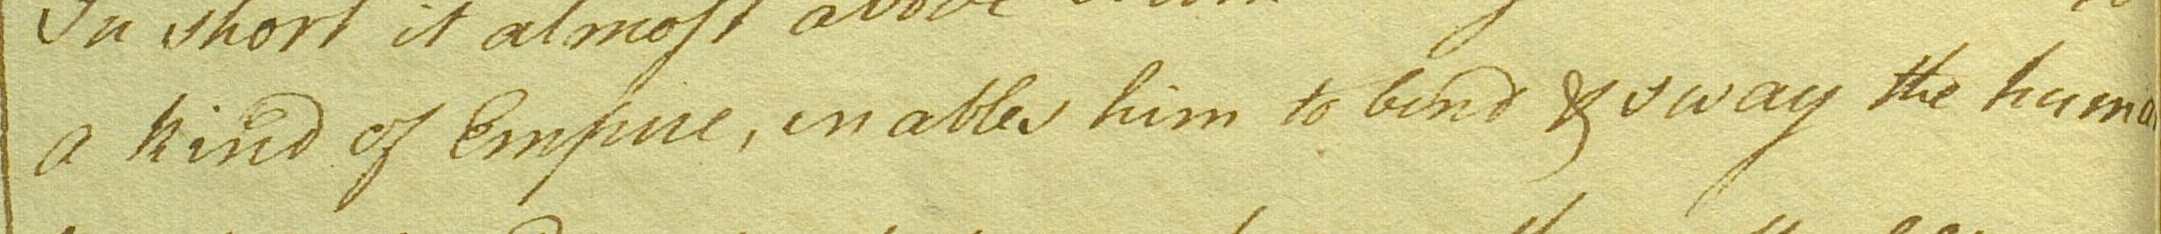a kind of Empire, enables him to bend & sway the human
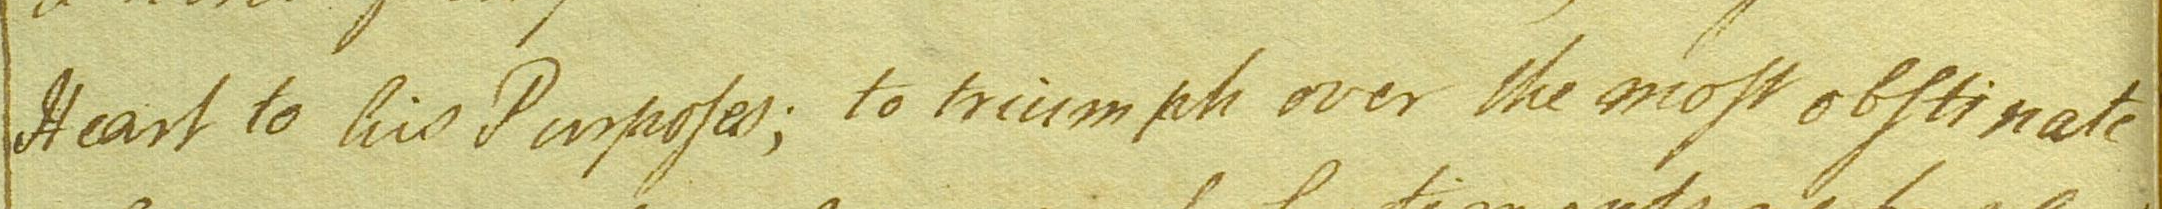Heart to his Purposes; to triumph over the most obstinate
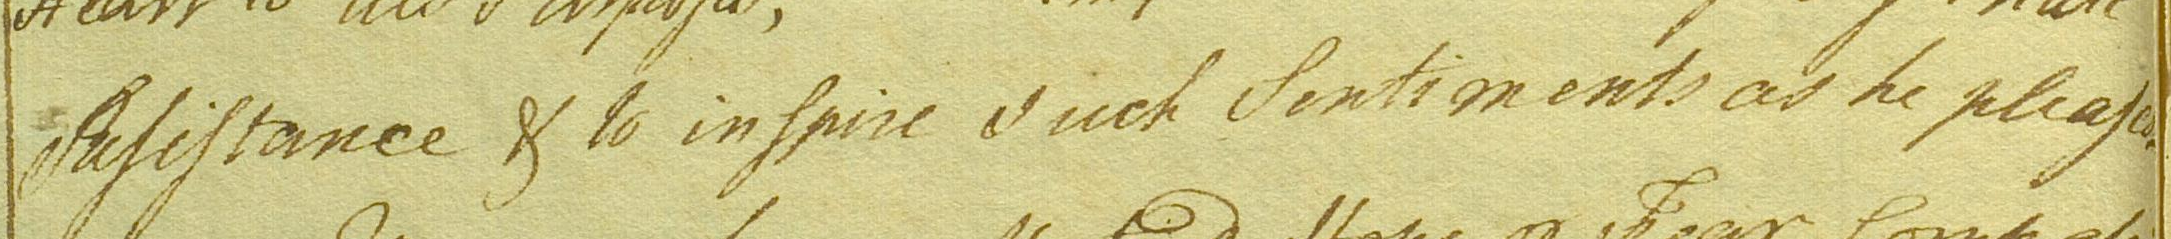Resistance & to inspire such Sentiments as he pleases.
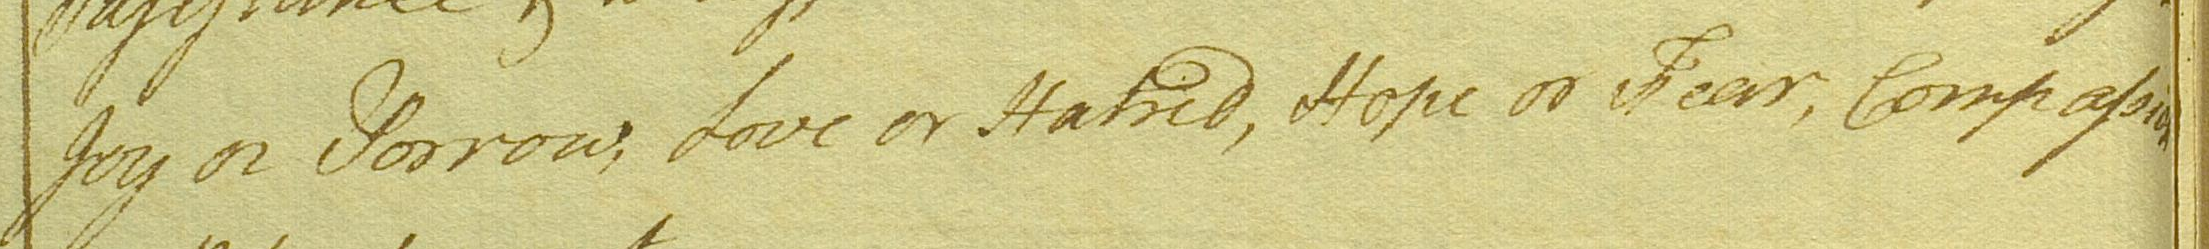Joy or Sorrow, Love or Hatred, Hope or Fear, Compassion
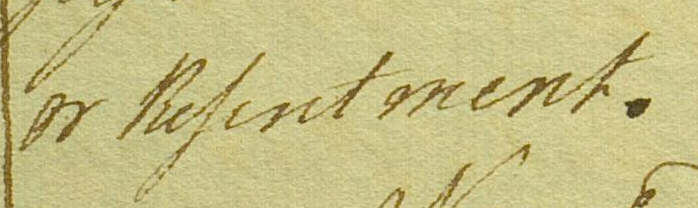or Resentment.
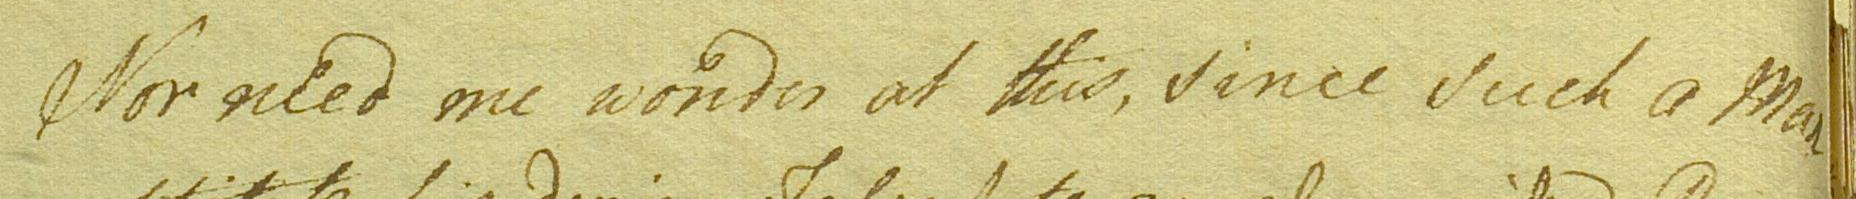Nor need one wonder at this, since such a Man
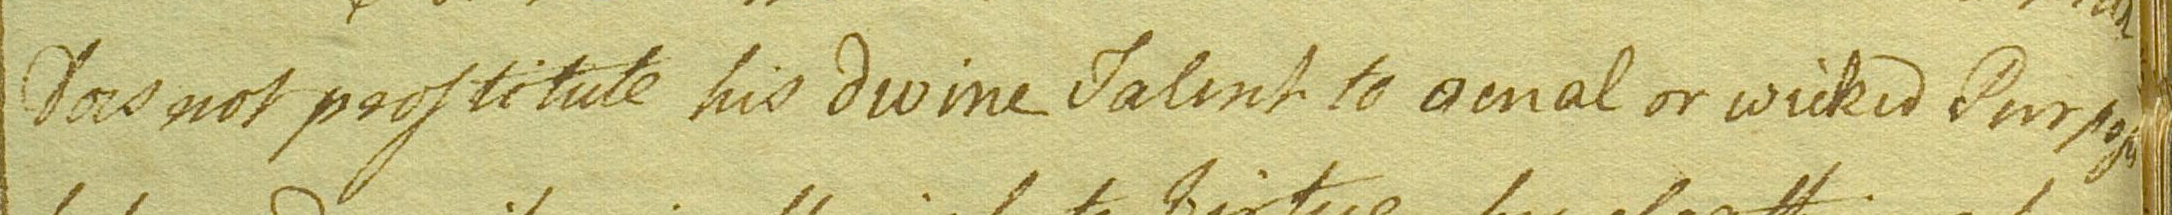does not prostitute his divine Talent to venal or wicked Purposes
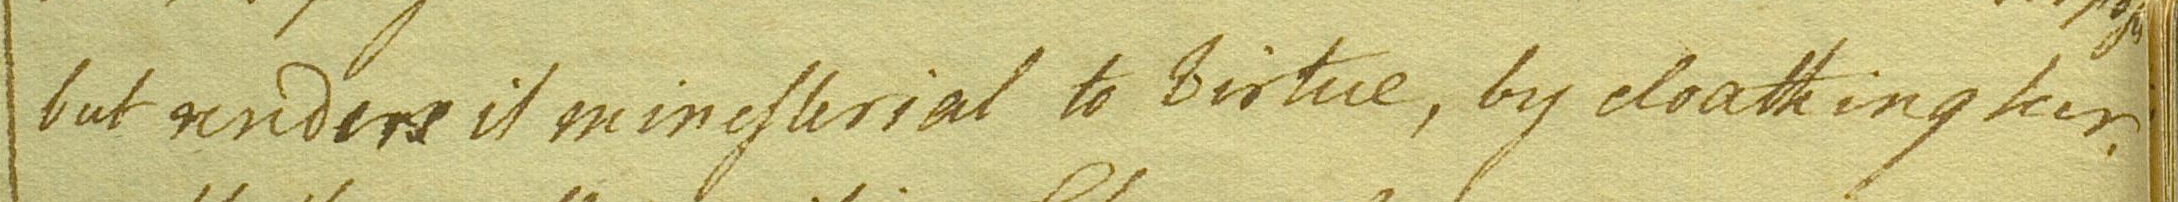but renders it minesterial to Virtue, by cloathing her
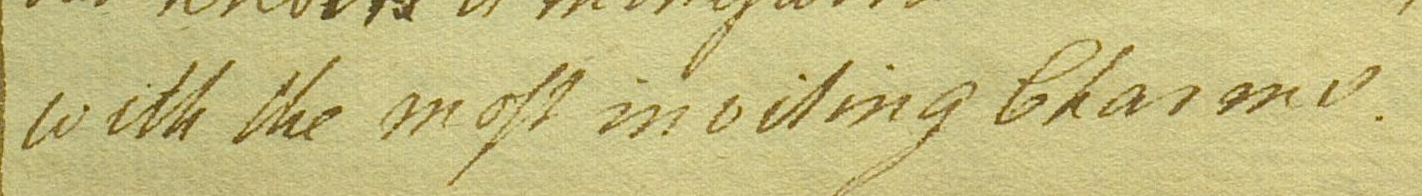with the most inviting Charmes.
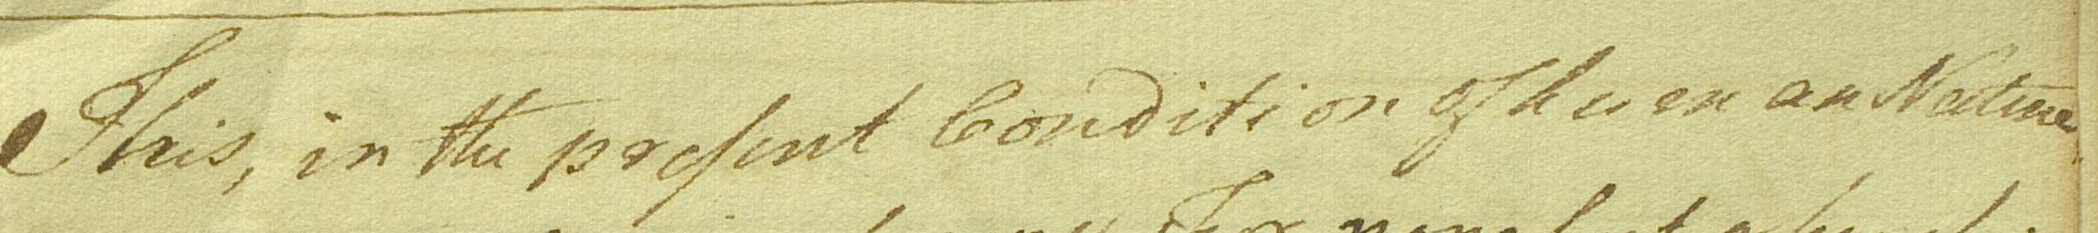This, in the present condition of human Nature
